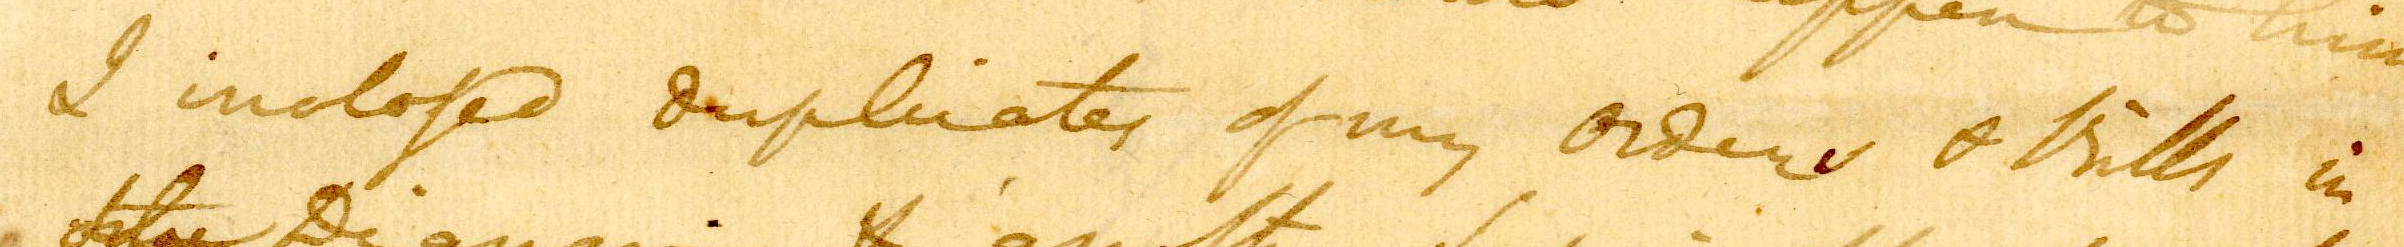I inclosed duplcates of my orders & Bills in
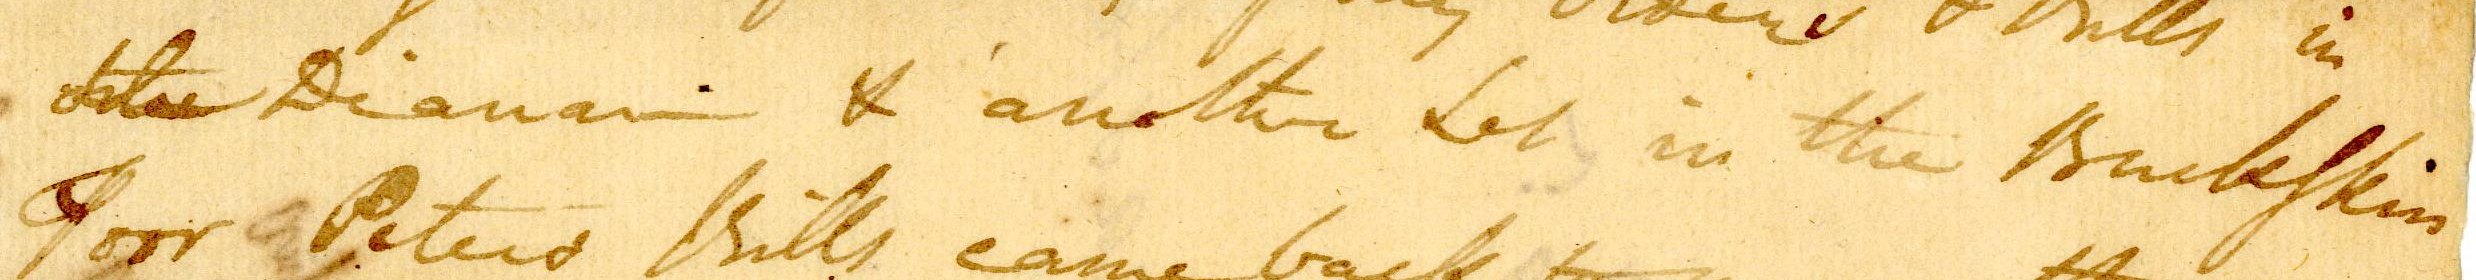on the Dianan & another let in the Buckskin
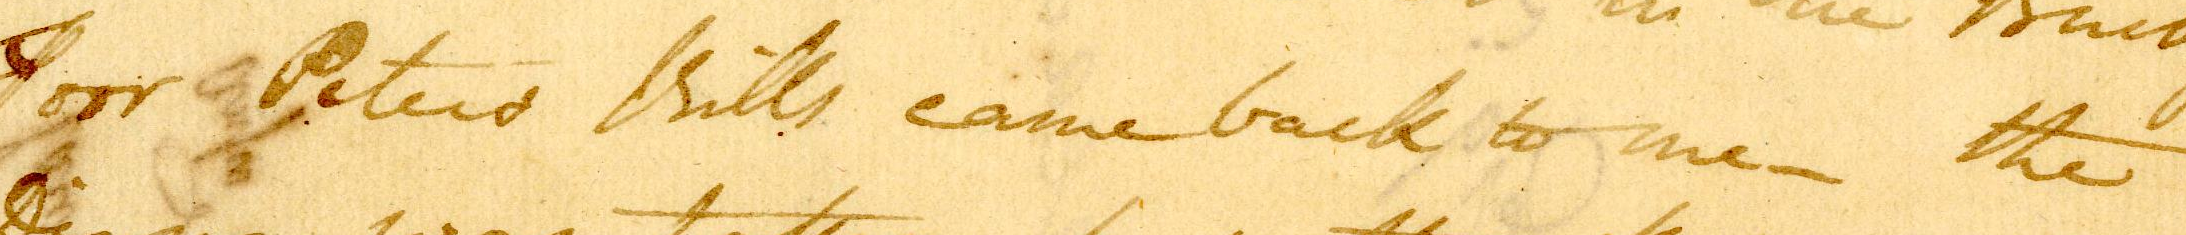Poor Peters Bills came back to me. the
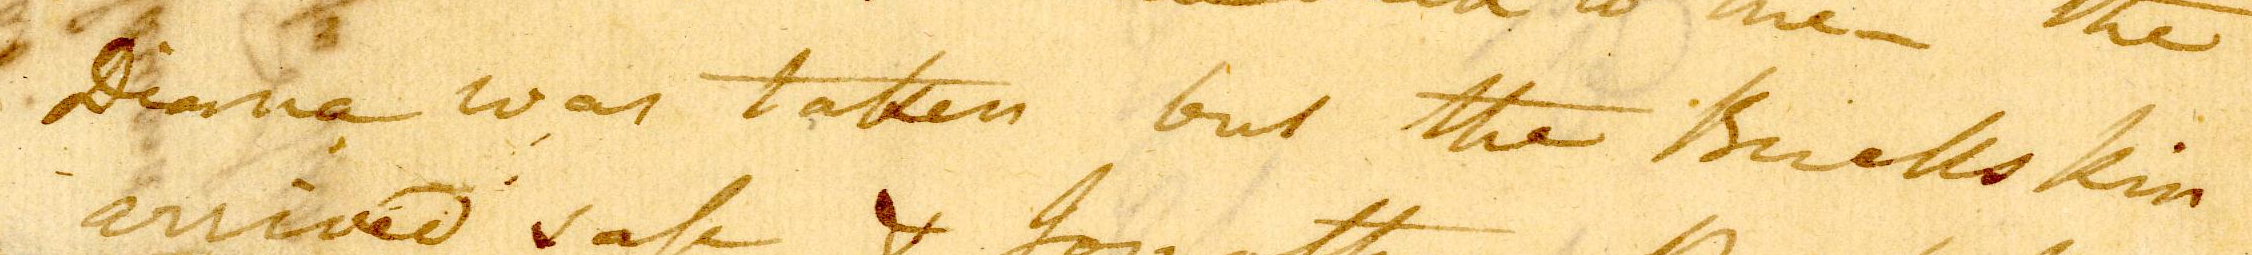Diana was taken but the Buckskin
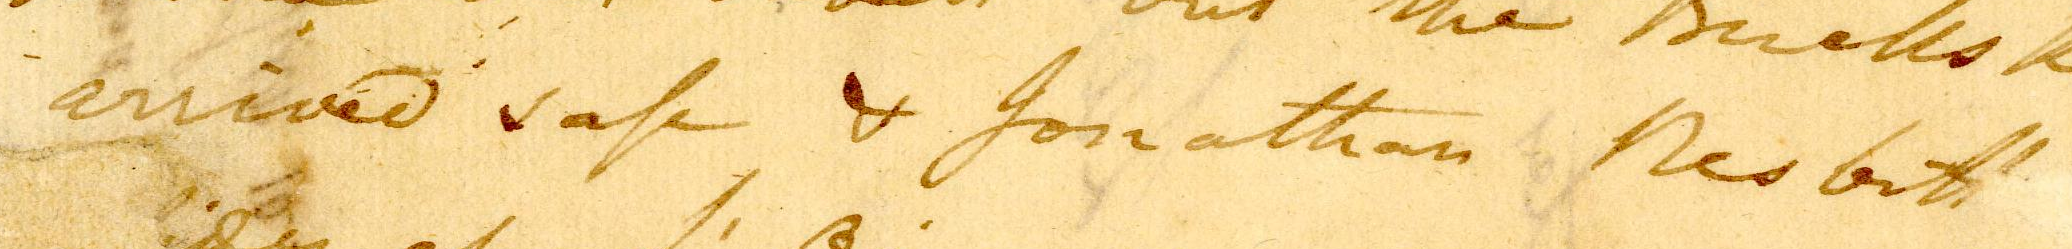arrived safe & Jonathan Nesbitt
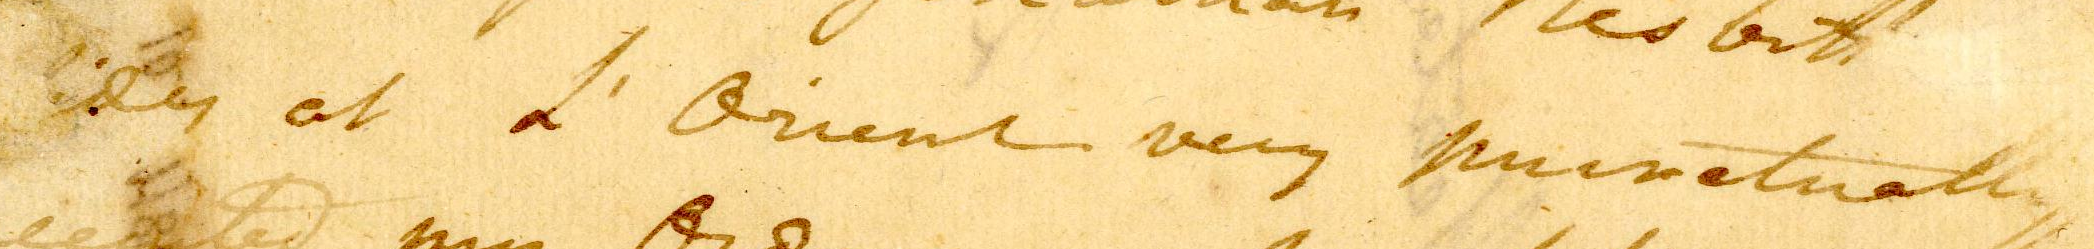was at L' Orient very punctually
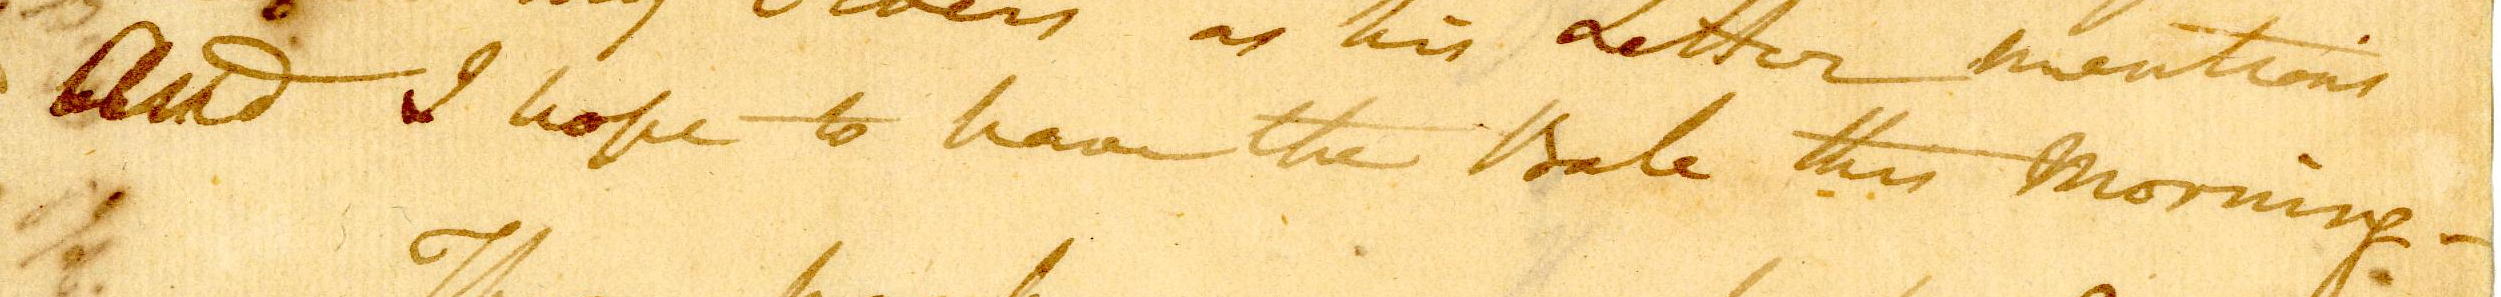Asked I hope to have the Bale this morning.
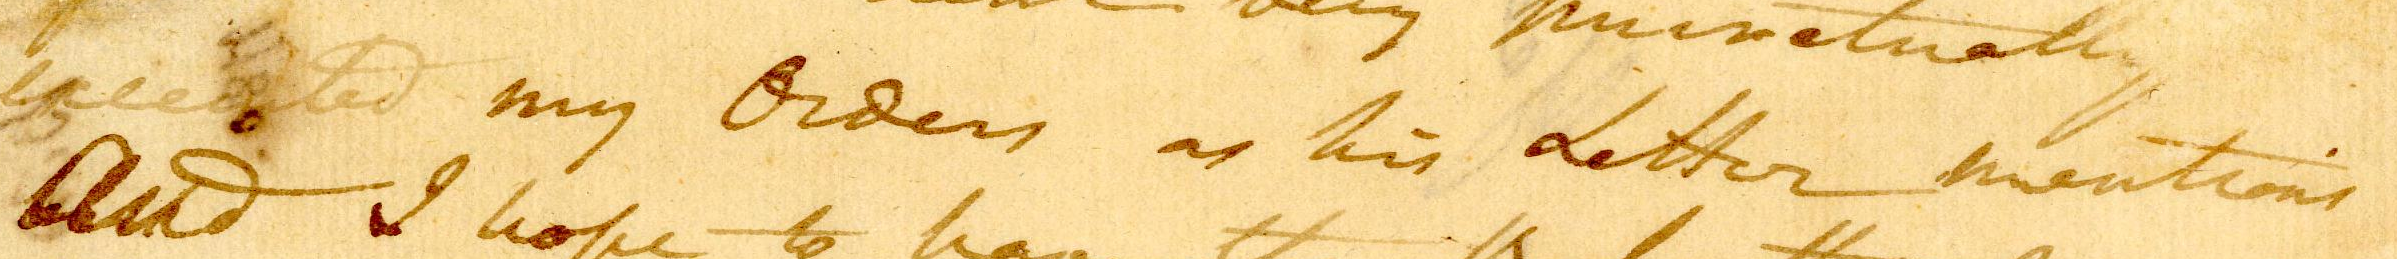expected my Orders as his Letter mentions
